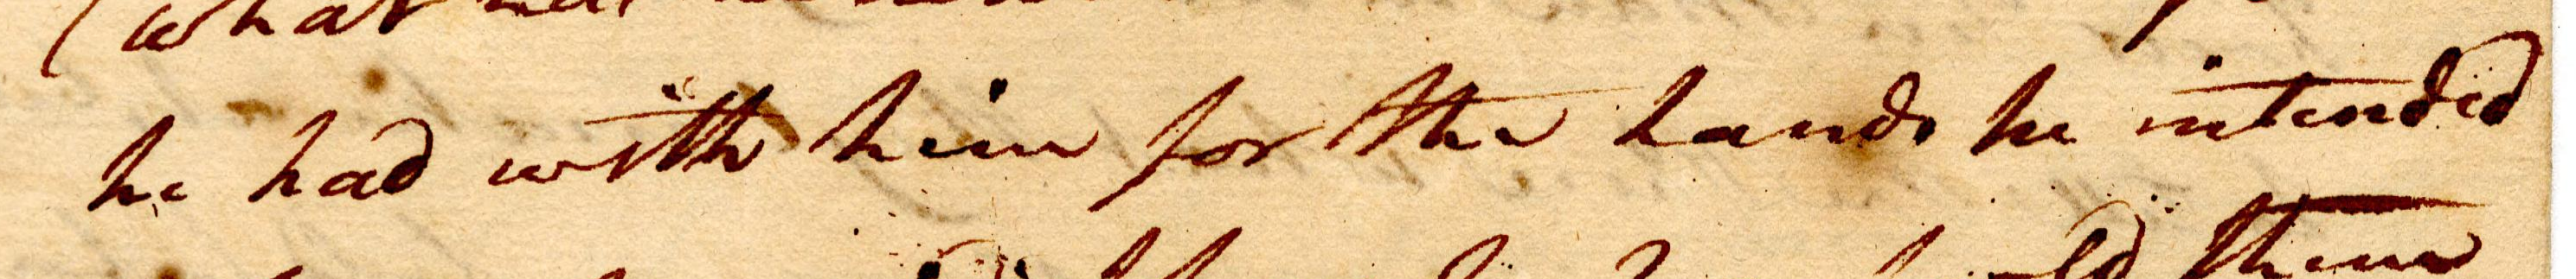he had with him for the Lands he intended
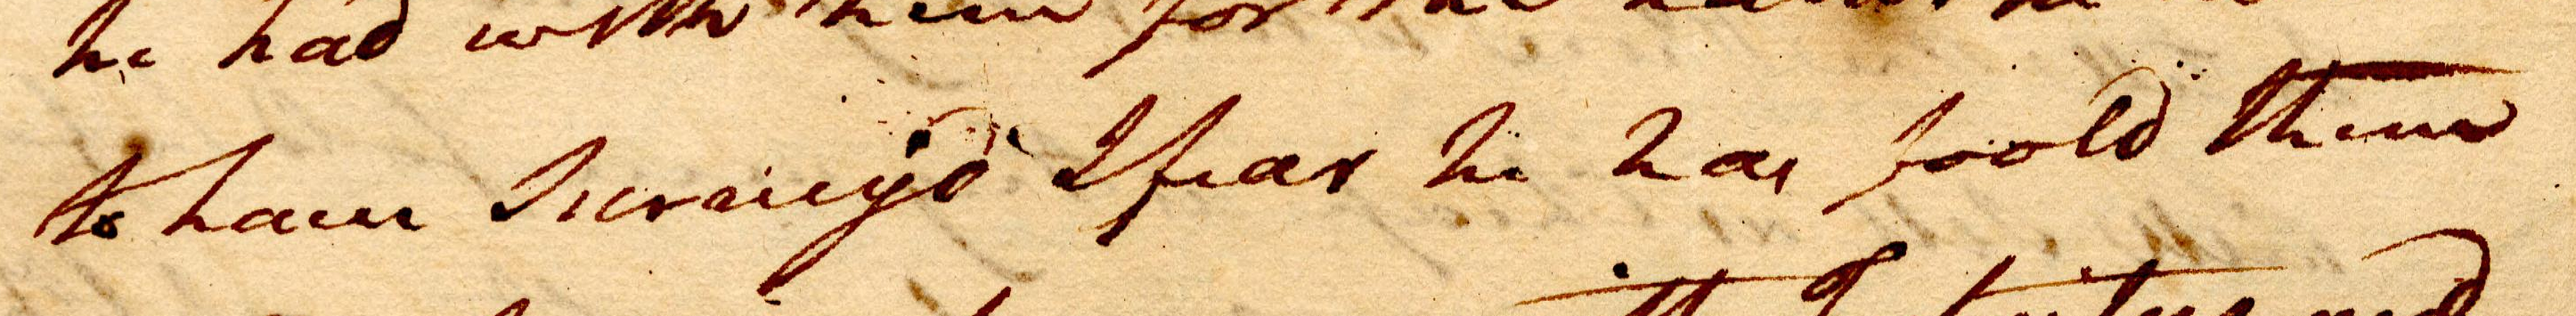to have Surveay'd I fear he has soold them
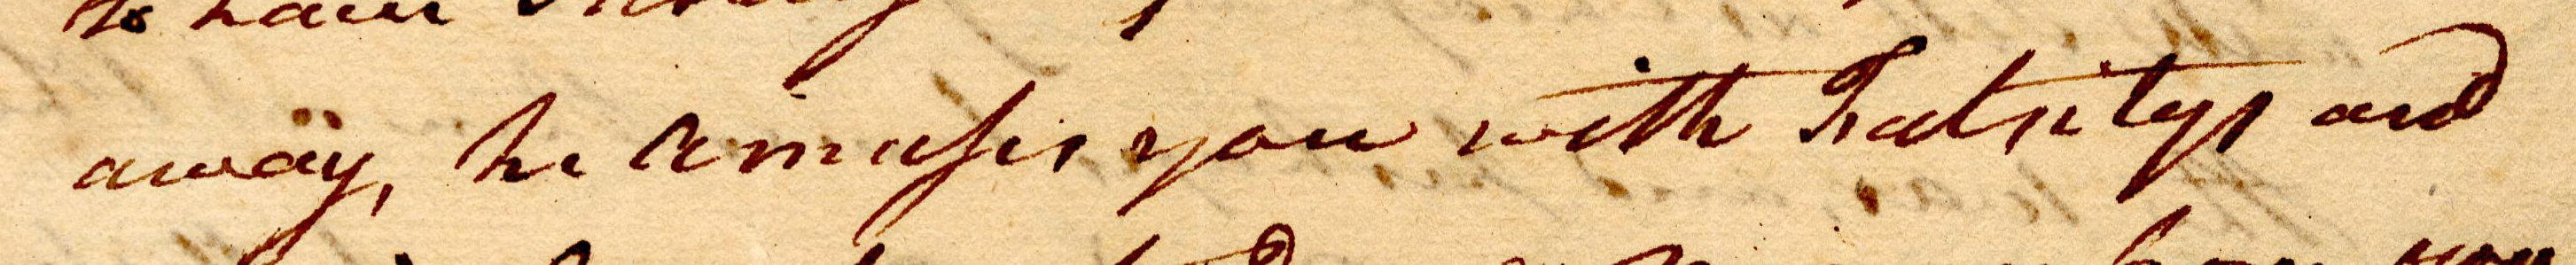away, he amuses you with Falsitys and
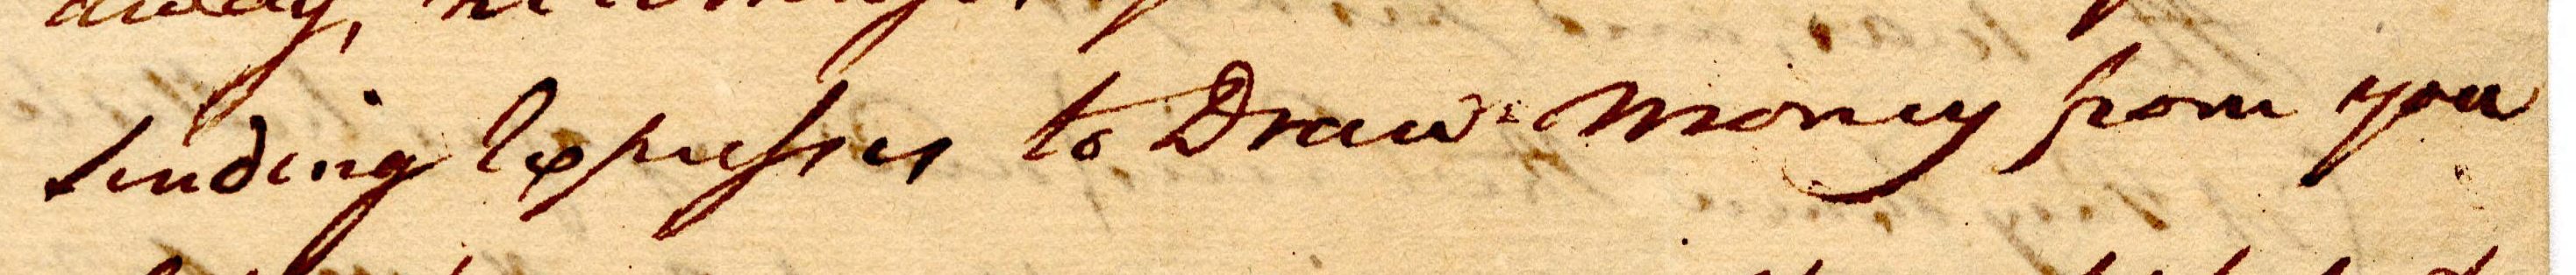sending expenses to Draw money from you
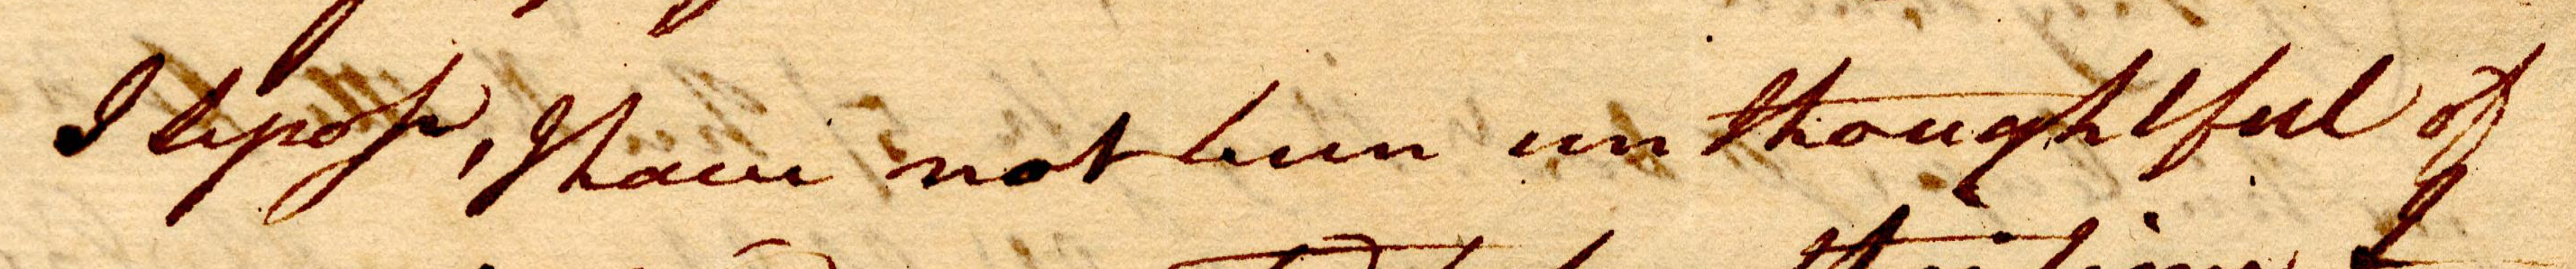I supose, I have not been un thoughtful of
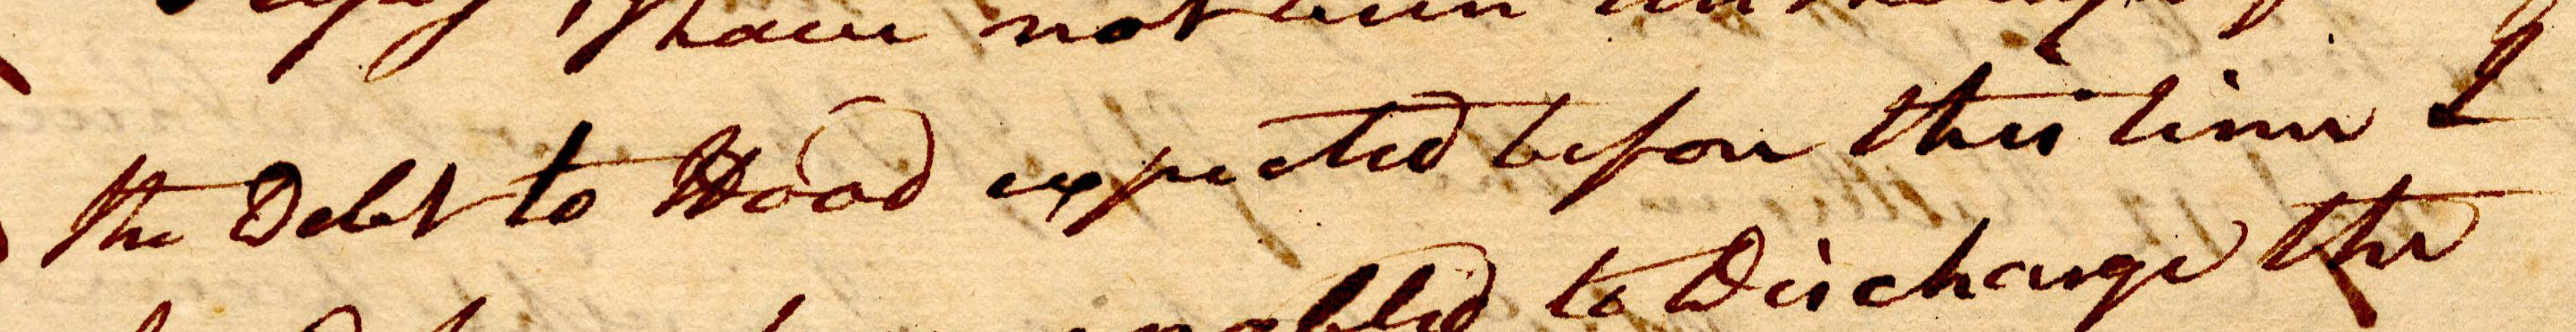the Debt to Hood expected before this time I
